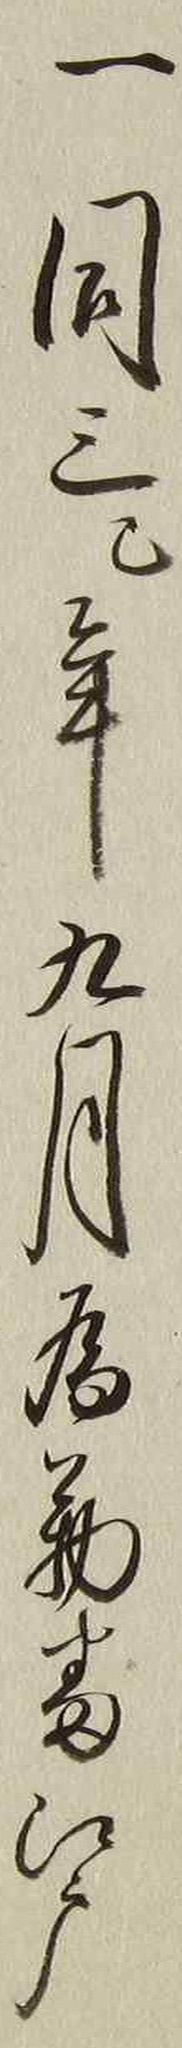一同三巳年九月為勤番江戸
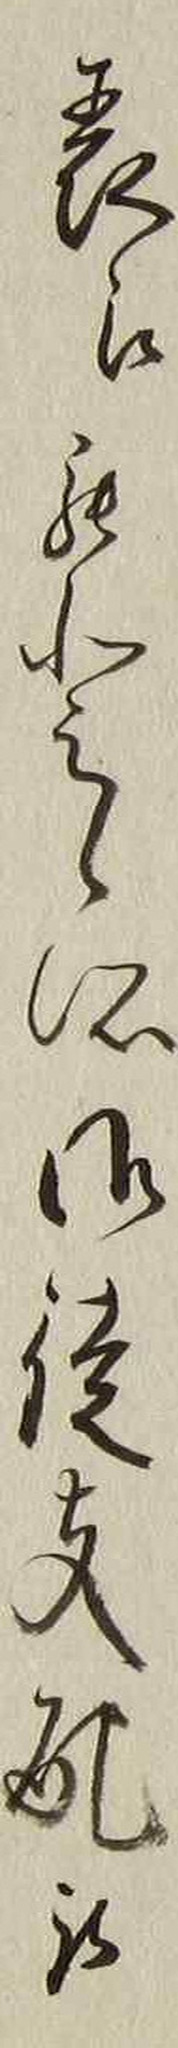表江罷登候所御徒支配被
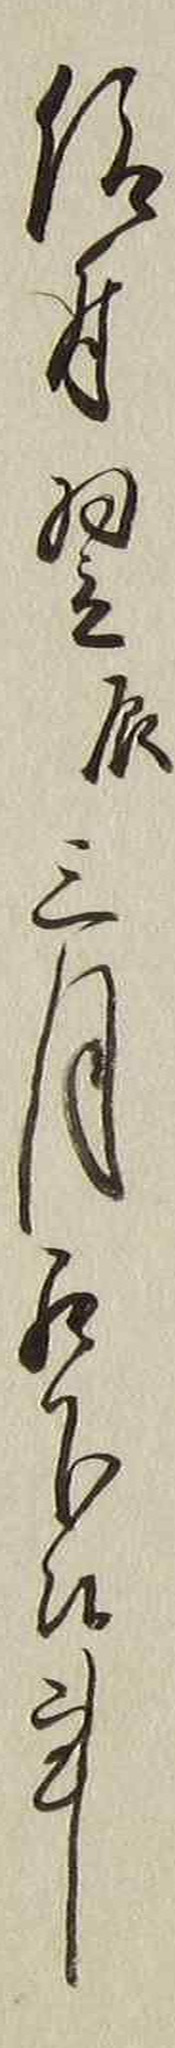仰付翌辰三月罷下候事
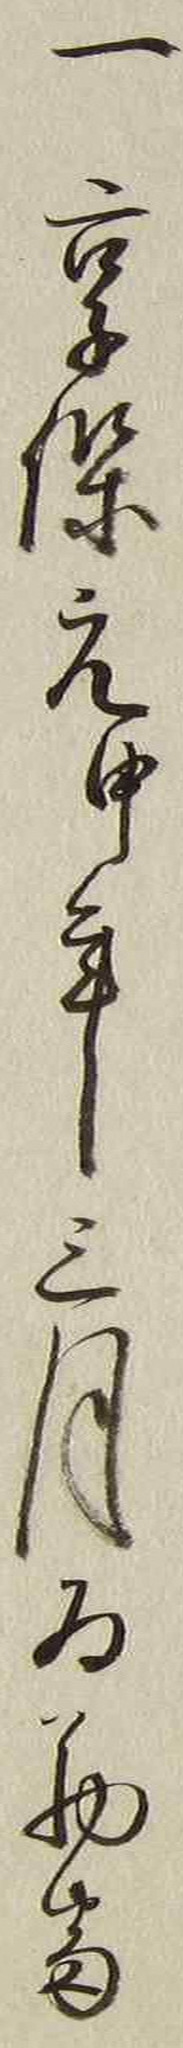一享保元申年三月為勤番
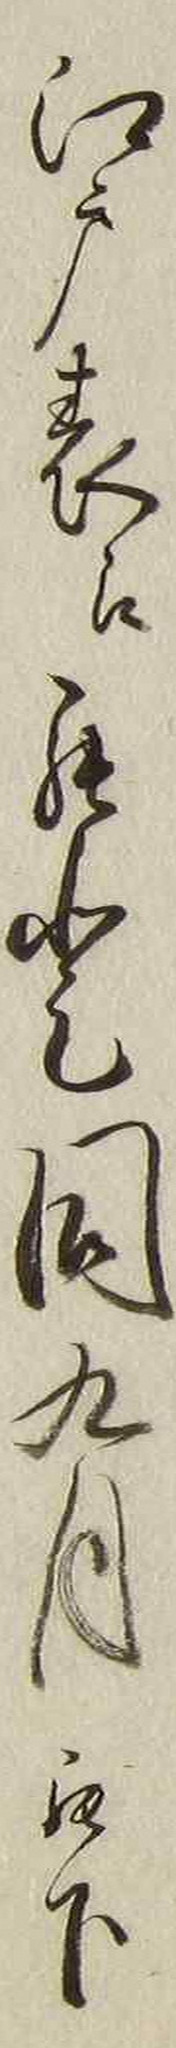江戸表江罷登同九月罷下

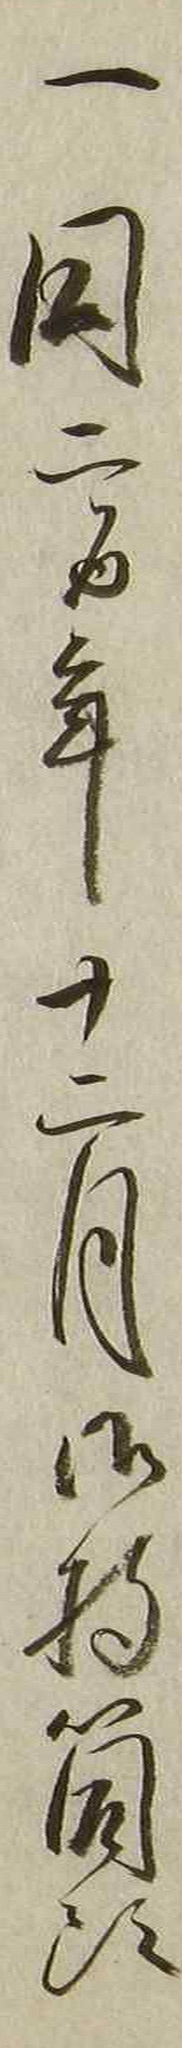一同二酉年十二月御持筒頭
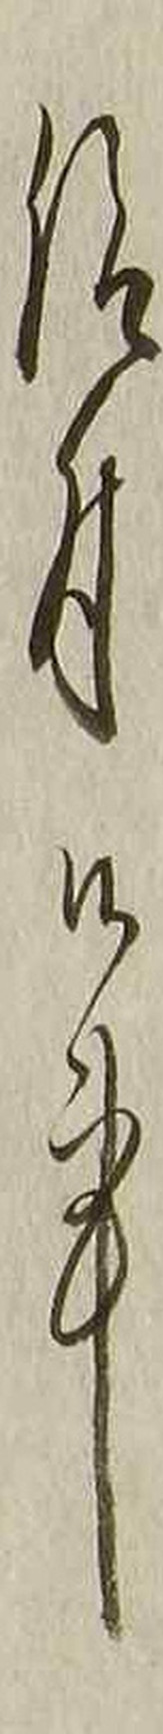仰付候事
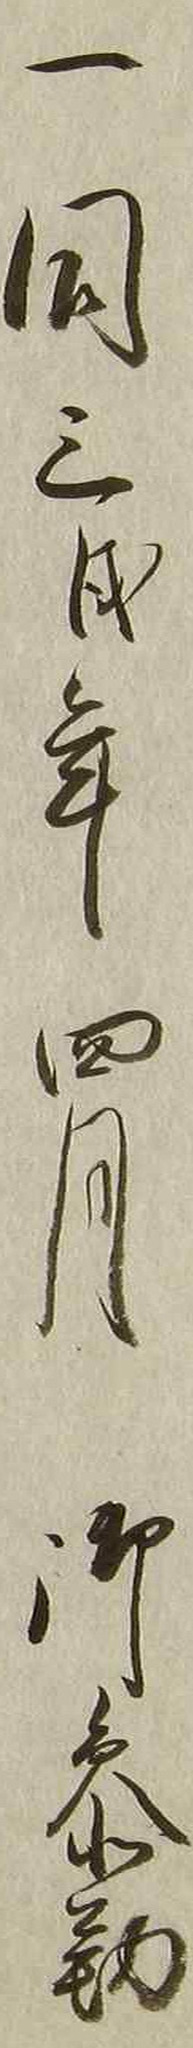一同三戌年四月御参勤
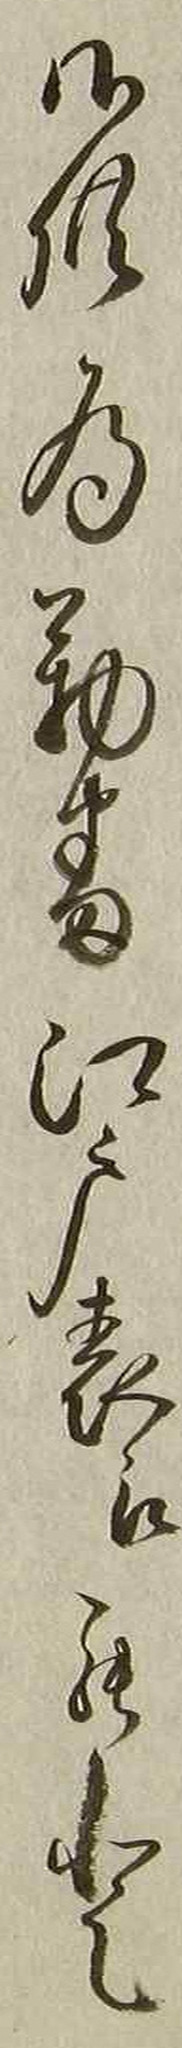御供為勤番江戸表江罷登
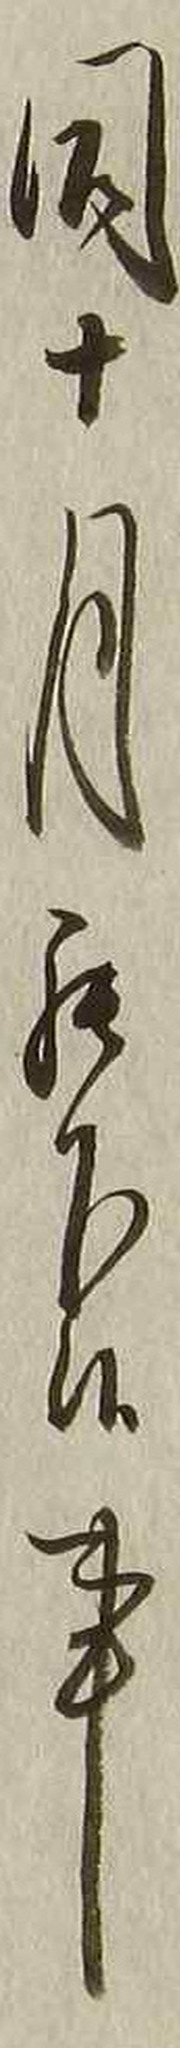同十月罷下候事
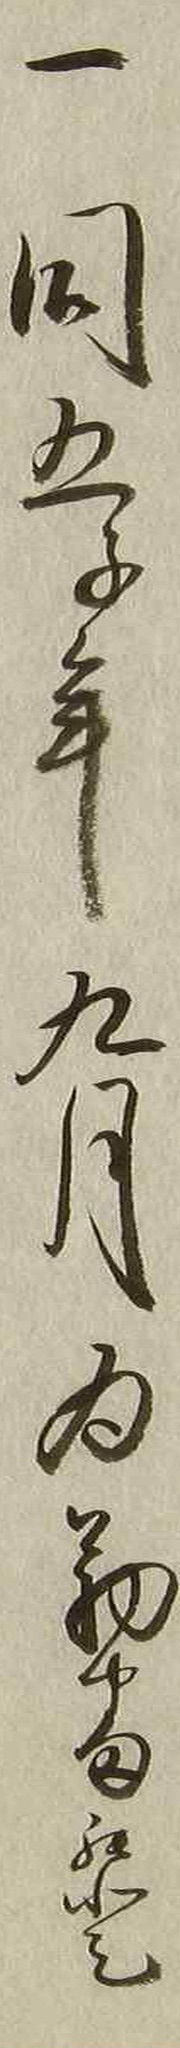一同五子年九月為勤番罷登
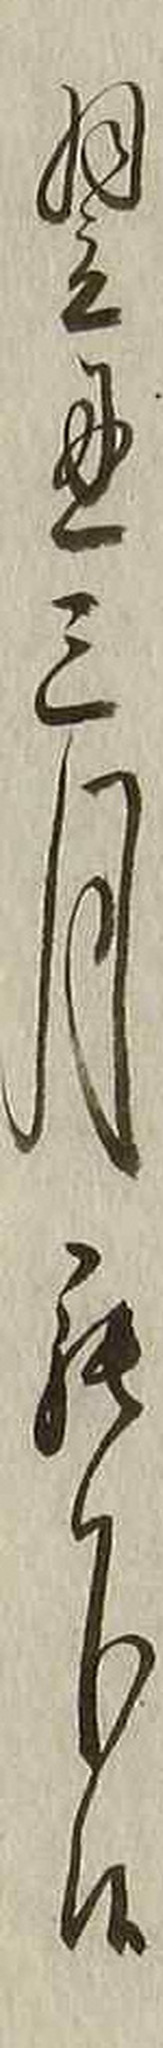翌丑三月罷下候
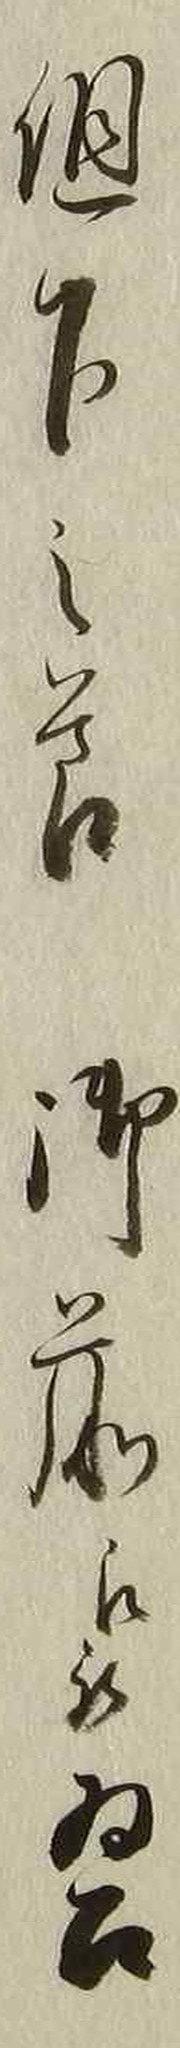但下之節御前江被為召
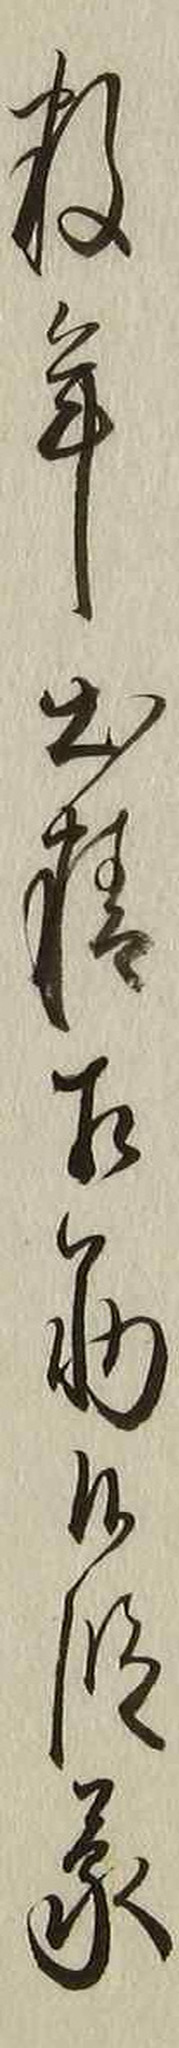数年出精相勤候段蒙
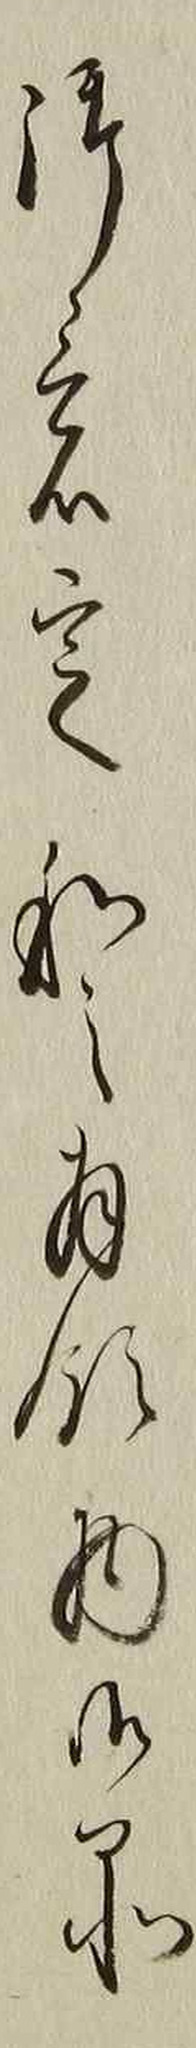御意定和之拝領物御品
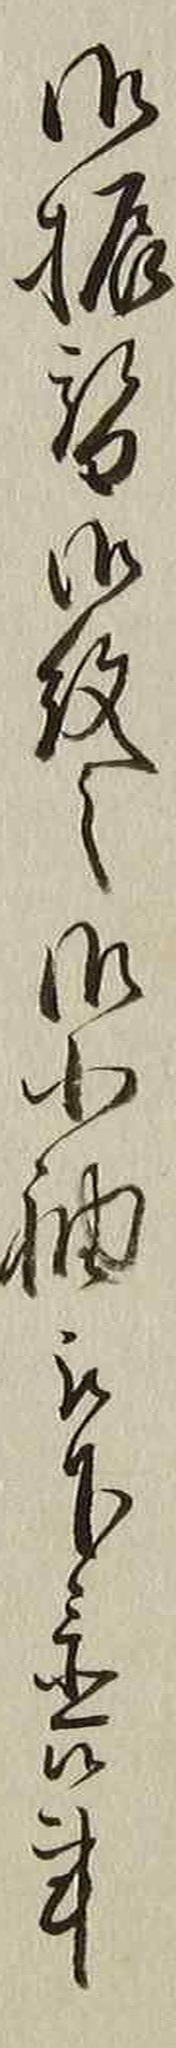御振替御紋之御小袖被下置候事
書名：諸士系譜　巻之18　い之部18
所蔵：会津若松市立会津図書館
